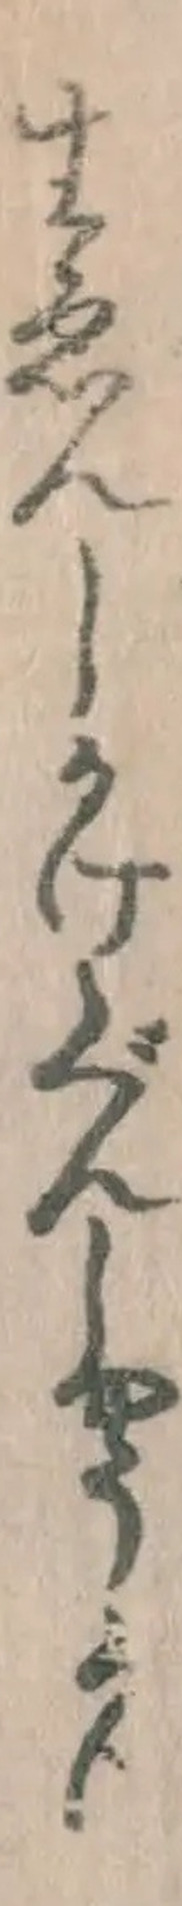生ゑんしかけぐんしやうたり
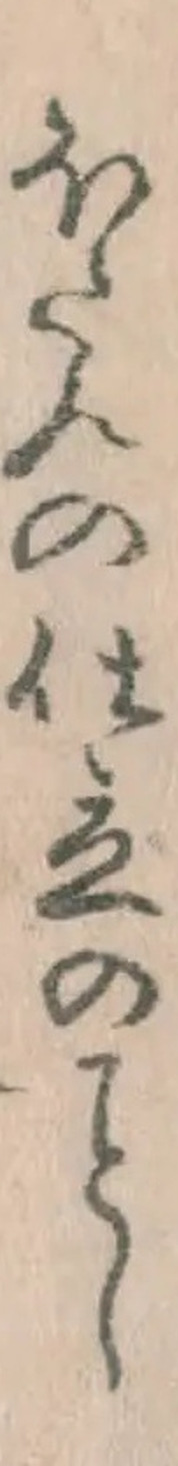ほたんの仕立のことし
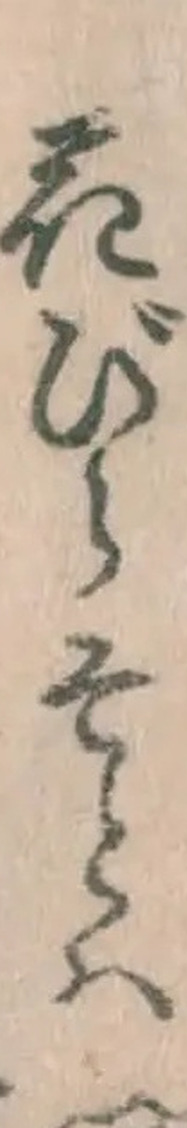花びらそとは
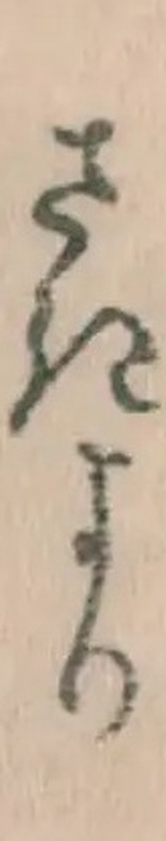さきより
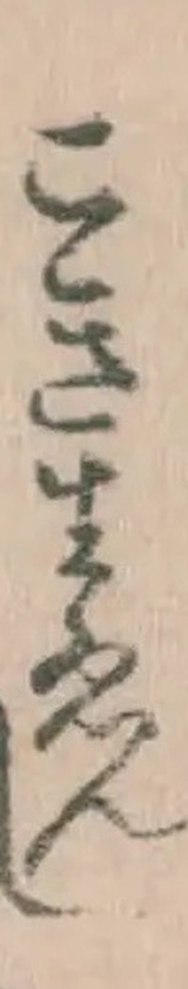こき生ゑんし
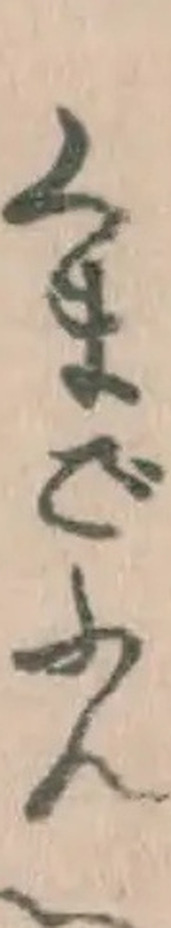くまごふん
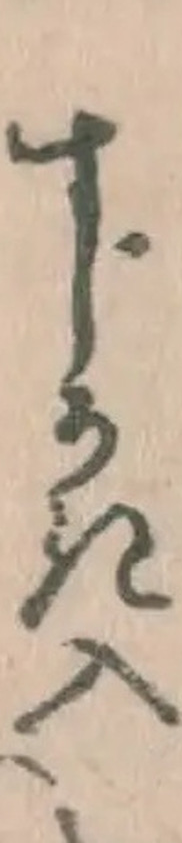すじかき入
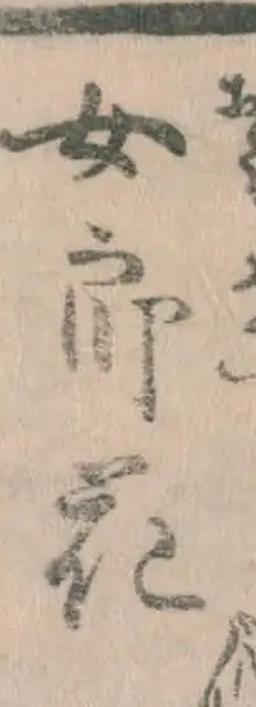女郎花
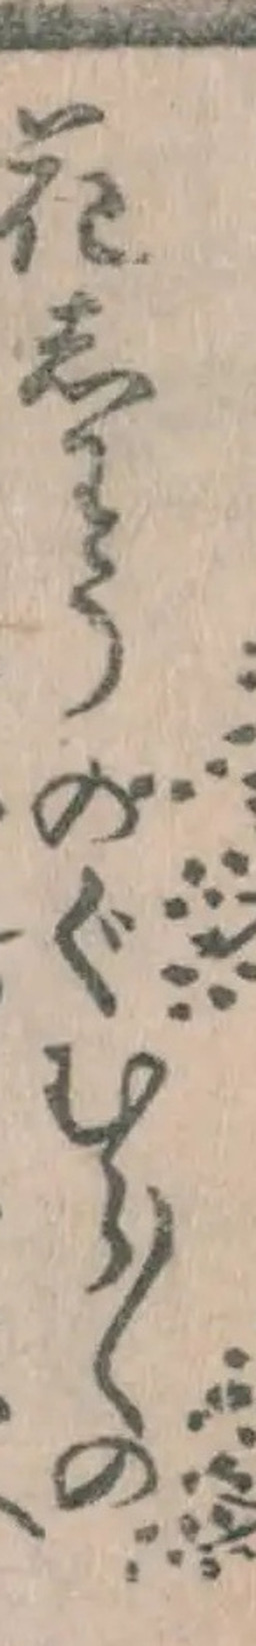花しわうのぐむら〳〵の
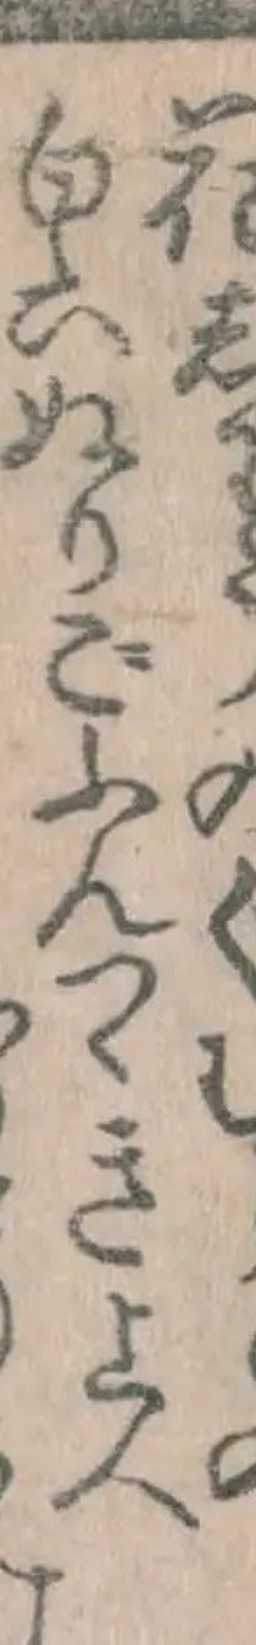白六ぬりごふんつゝき上へ
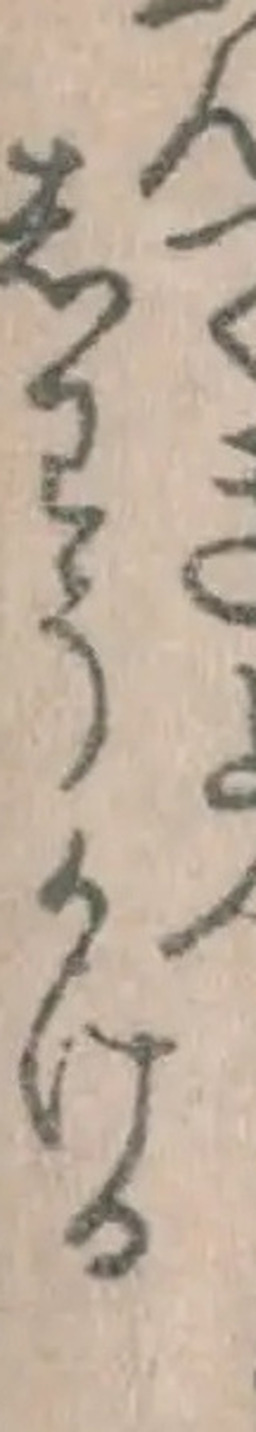しわうかける
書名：絵本時津艸
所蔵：国立国会図書館 National Diet Library, JAPAN
